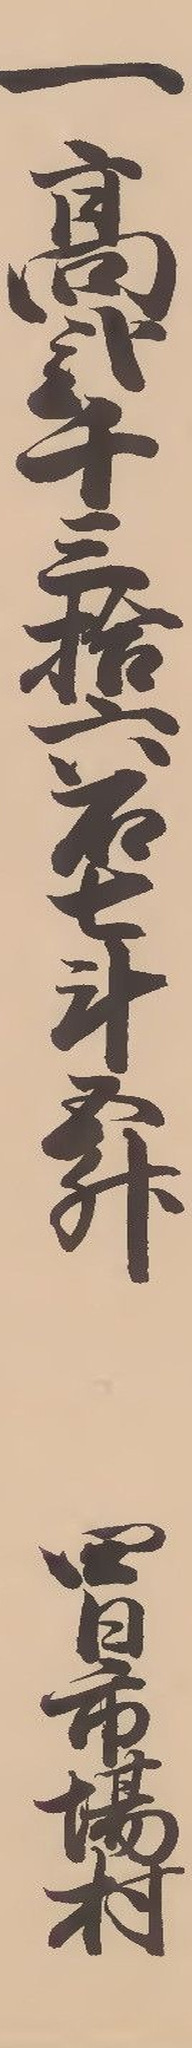一高弐千三拾六石七斗五升四日市場村
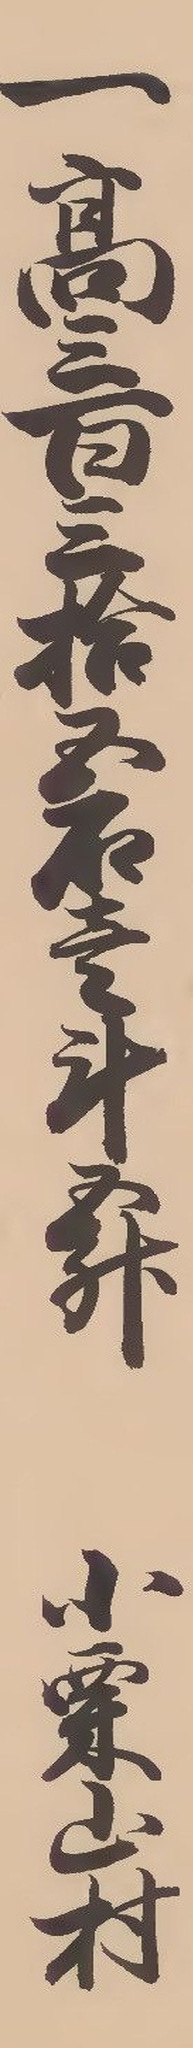一高三百三拾五石壱斗五升小栗山村
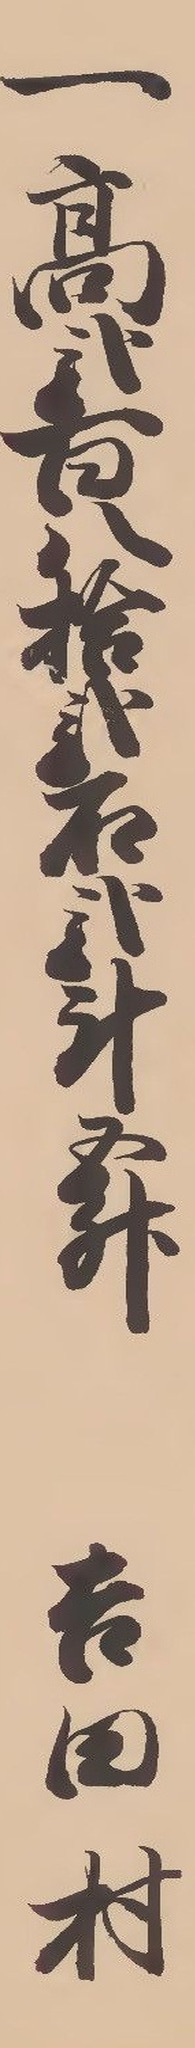一高弐百八拾弐石弐斗五升吉田村
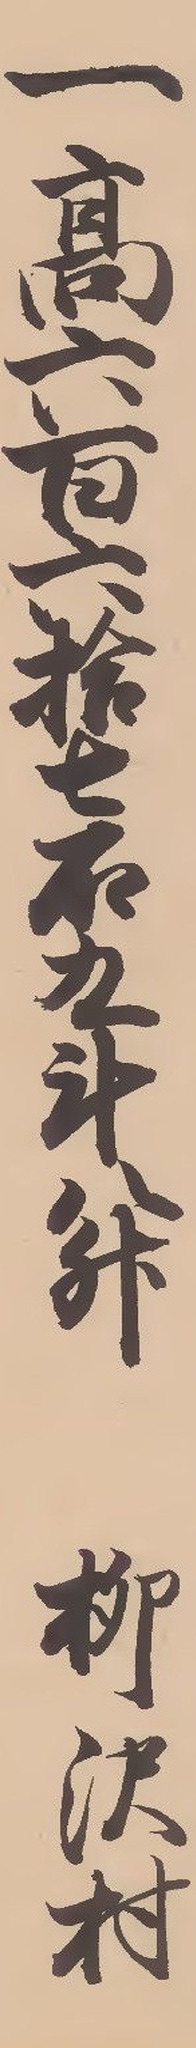一高六百六拾七石九斗八升柳沢村
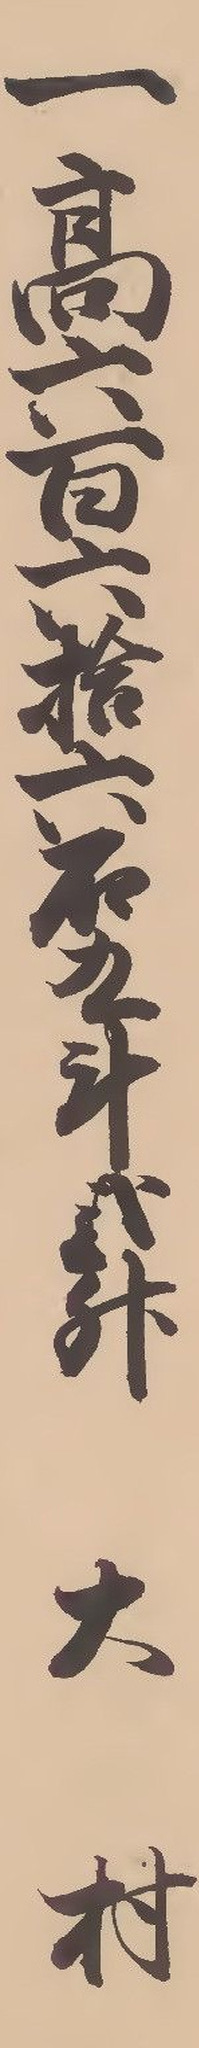一高六百六拾六石九斗弐升大村
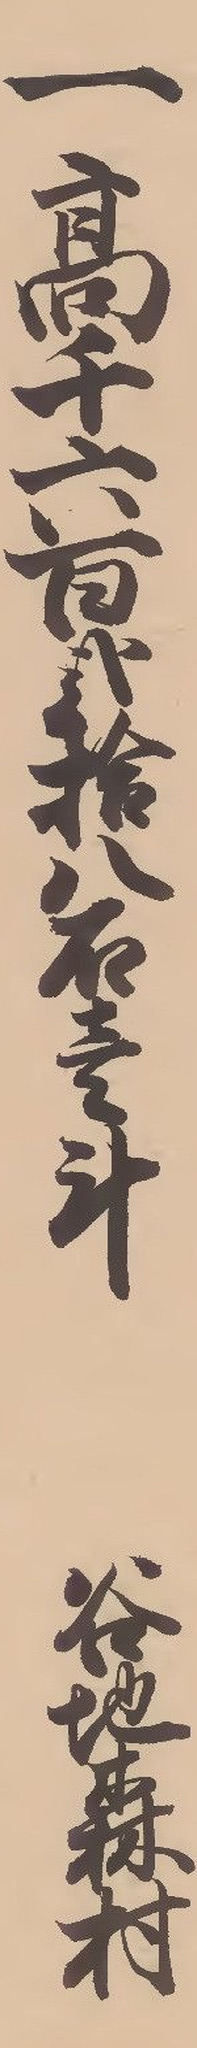一高千六百弐拾八石壱斗谷地森村
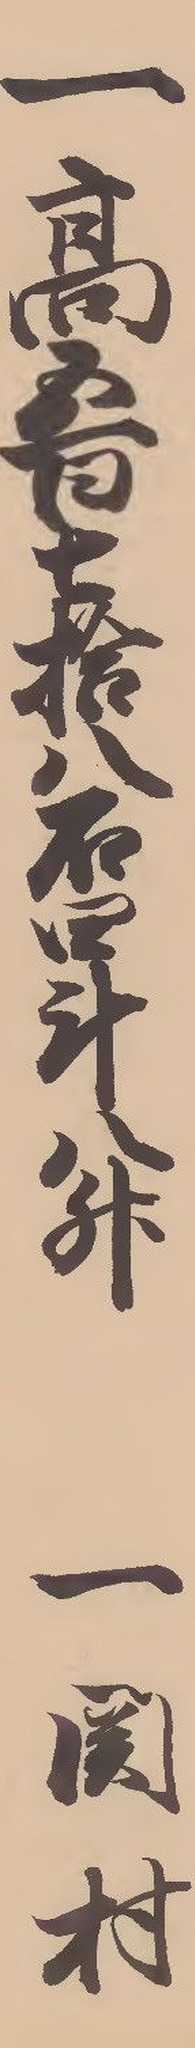一高五百七拾八石四斗八升一関村

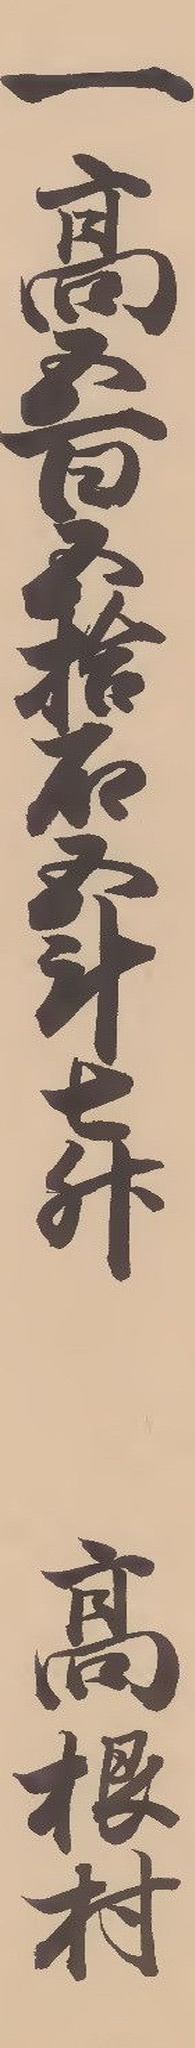一高五百五拾石五斗七升高根村
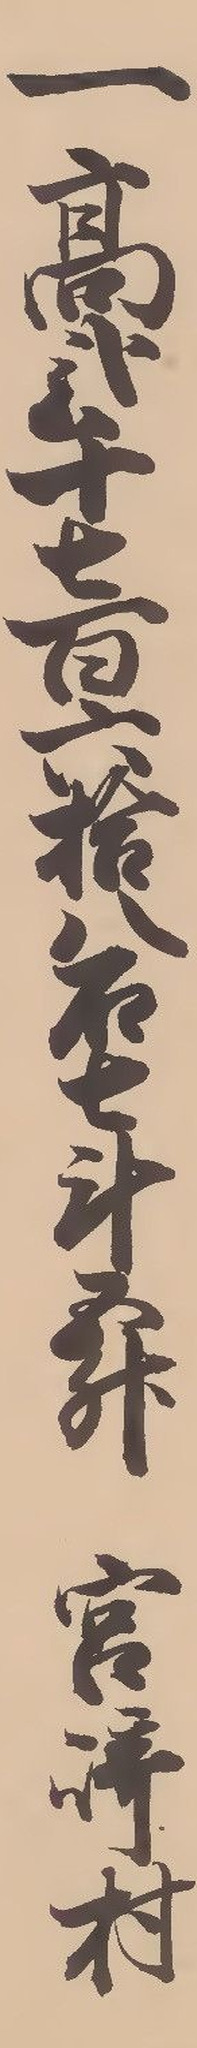一高弐千七百六拾八石七斗五升宮崎村
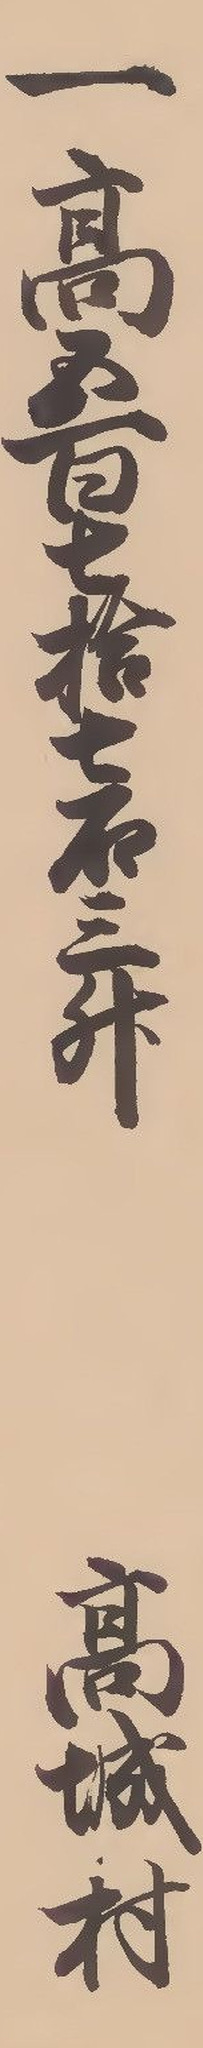一高五百七拾七石三升高城村
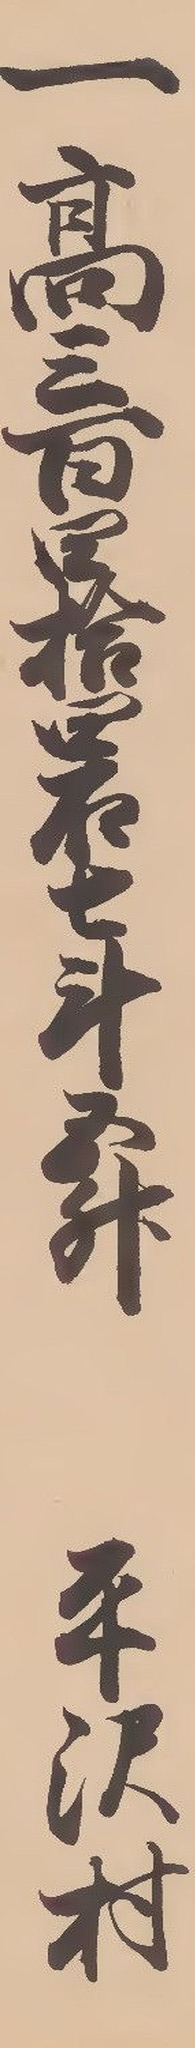一高三百四拾四石七斗五升平沢村
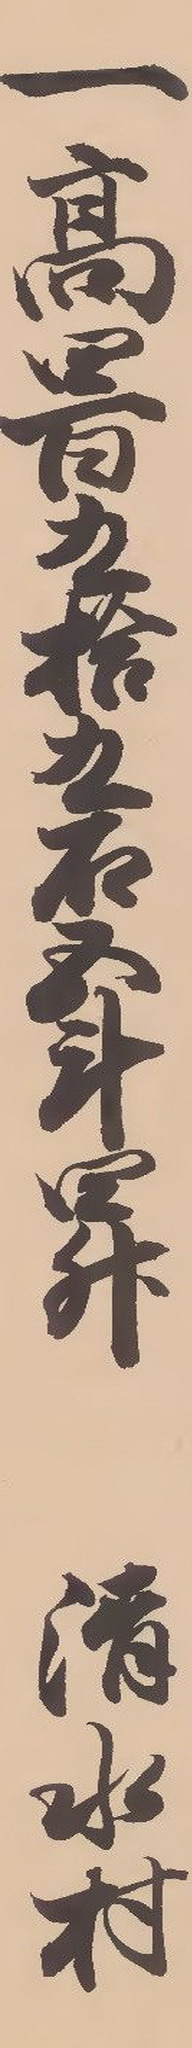一高四百九拾九石五斗四升清水村
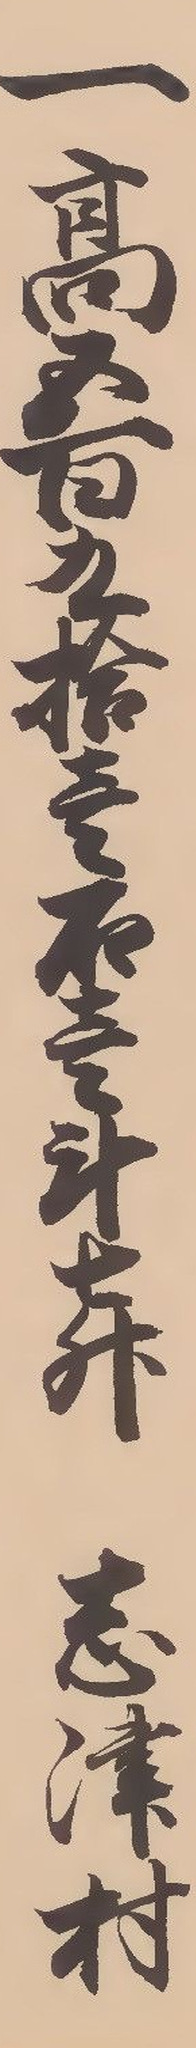一高五百九拾壱石壱斗七升志津村
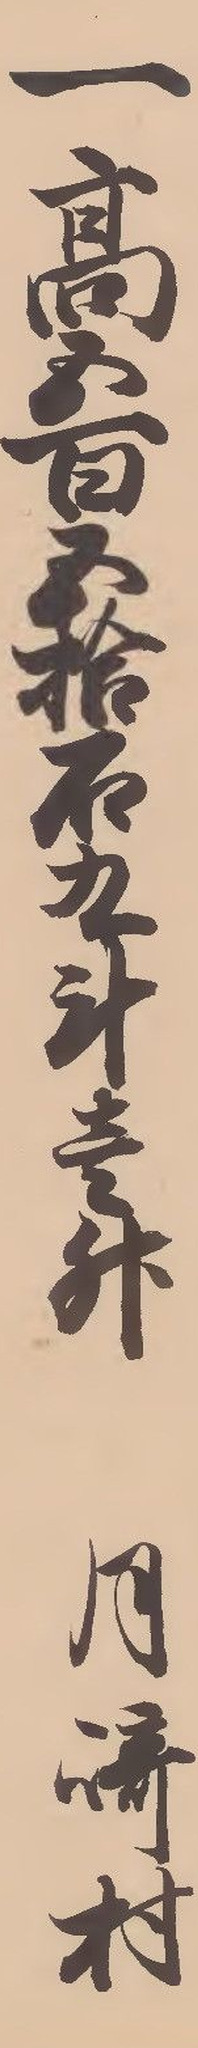一高五百五拾石九斗壱升月崎村
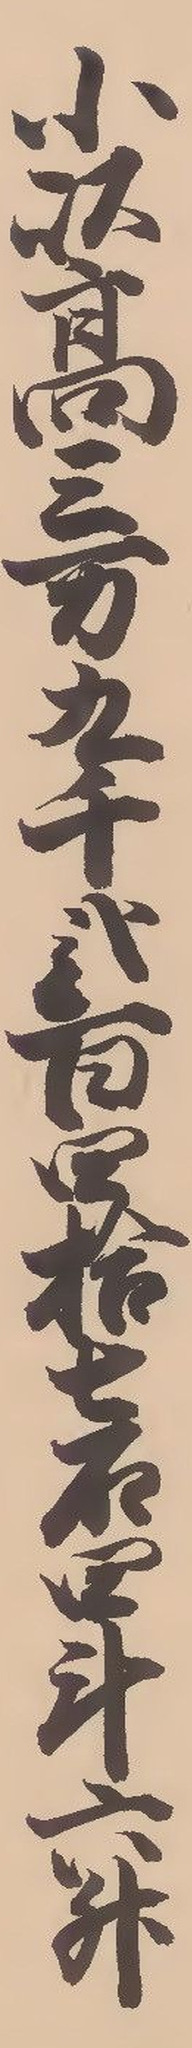小以高三万九千弐百四拾七石四斗六升

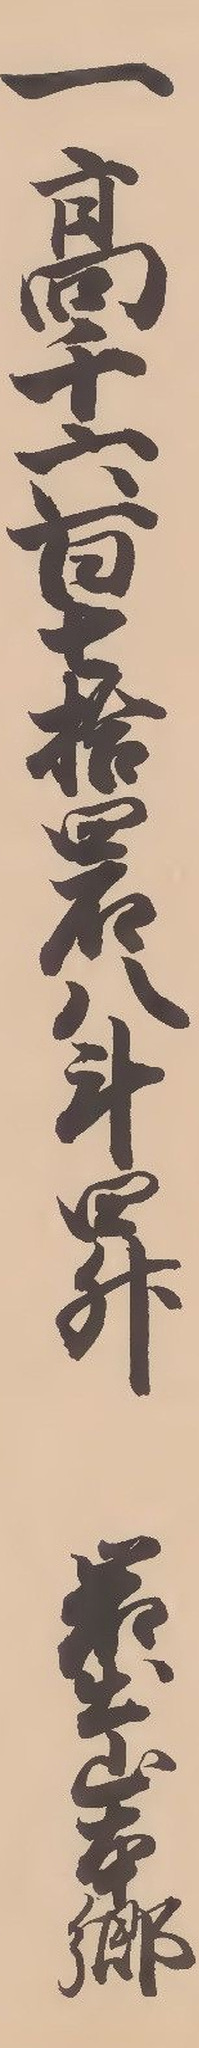一高千六百七拾四石八斗四升岩出山本郷
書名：陸奥国郷帳　５
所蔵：国立公文書館 National Archives of Japan
